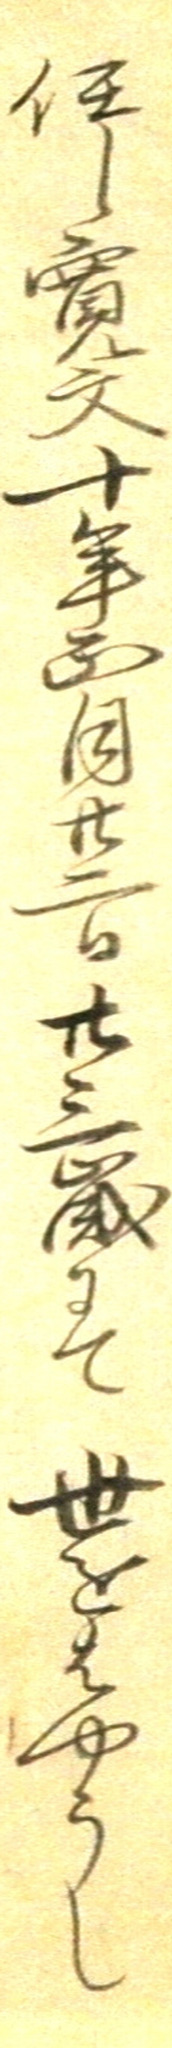任し寛文十年正月廿二日廿三歳にて世をはやうし
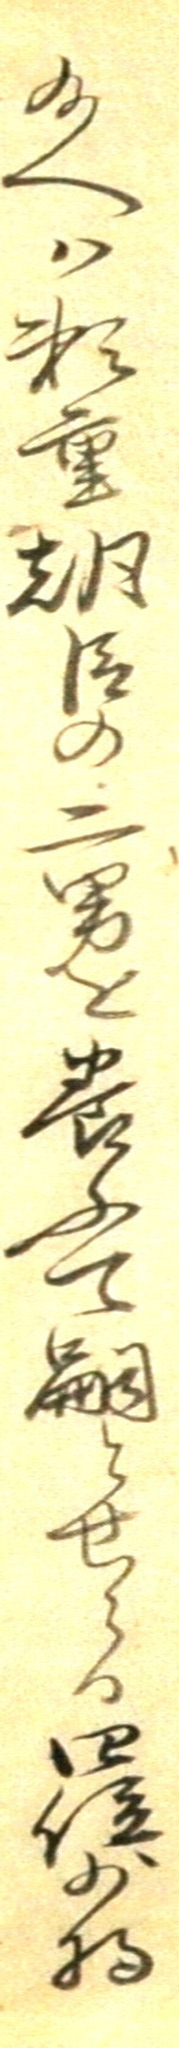給へは頼重朝臣の二男を養ふて嗣とせらる四位少将
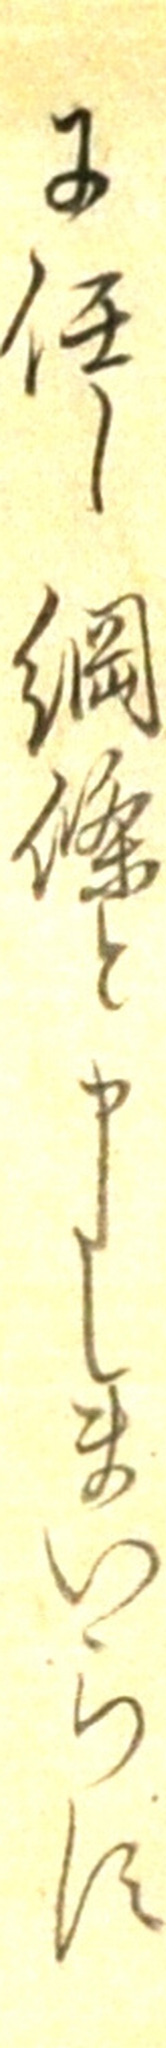に任し綱条と申しまいらす
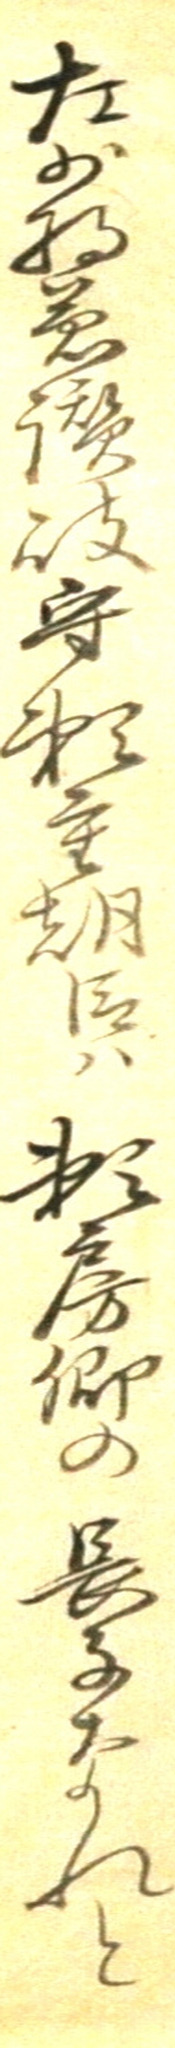左少将兼讃岐守頼重朝臣は頼房卿の長子なれと
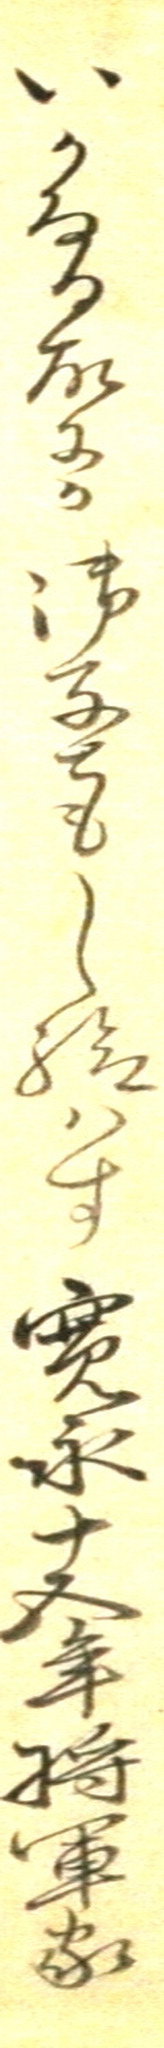いかなる故にか御子ともし給はす寛永十五年将軍家
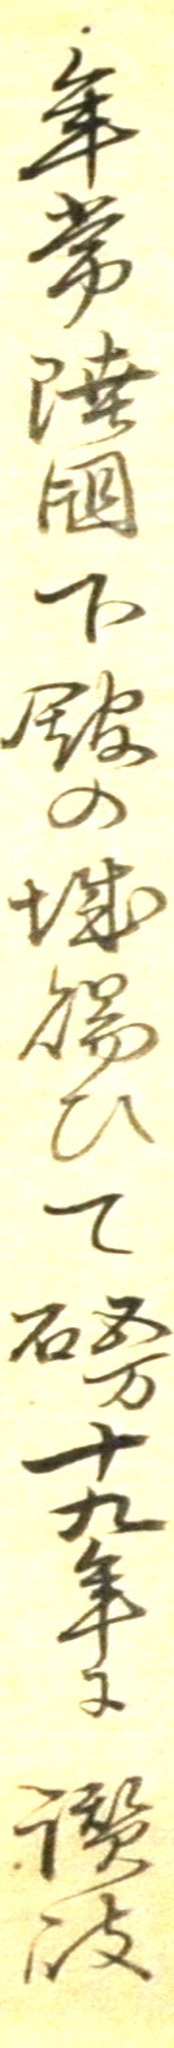年常陸国下館の城賜ひて五万石十九年に讃岐
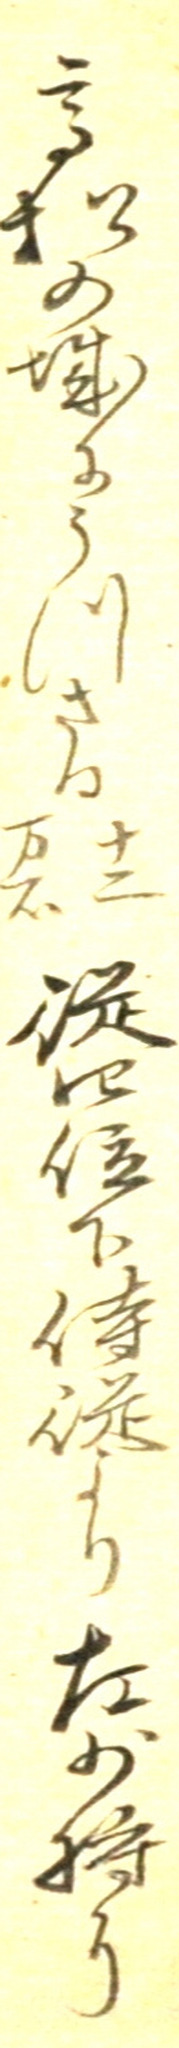高松の城にうつさる十二万石従四位下侍従より左少将に
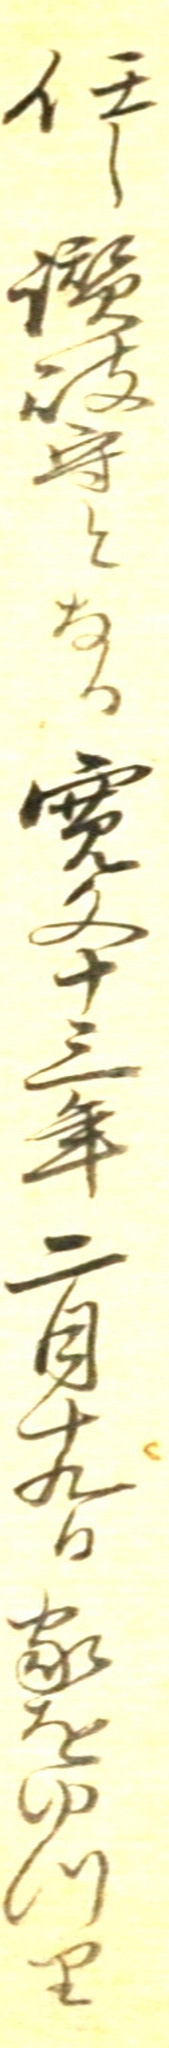任し讃岐守となる寛文十三年二月十九日家をゆつり
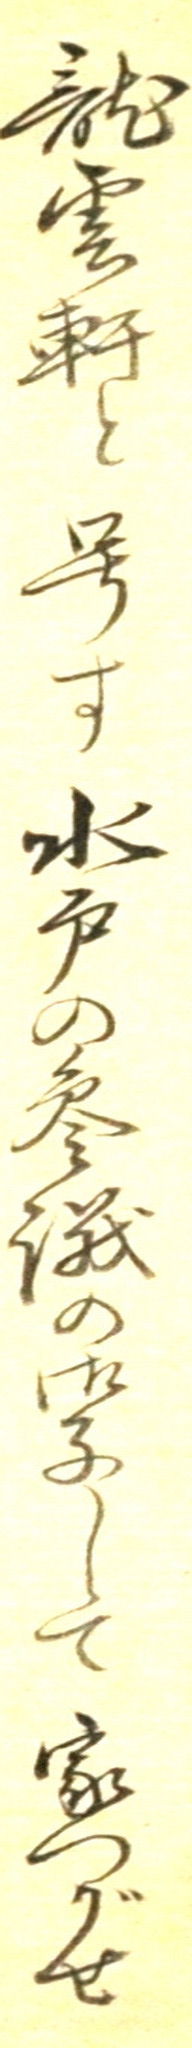竜雲軒と号す水戸の参議の御子して家つがせ
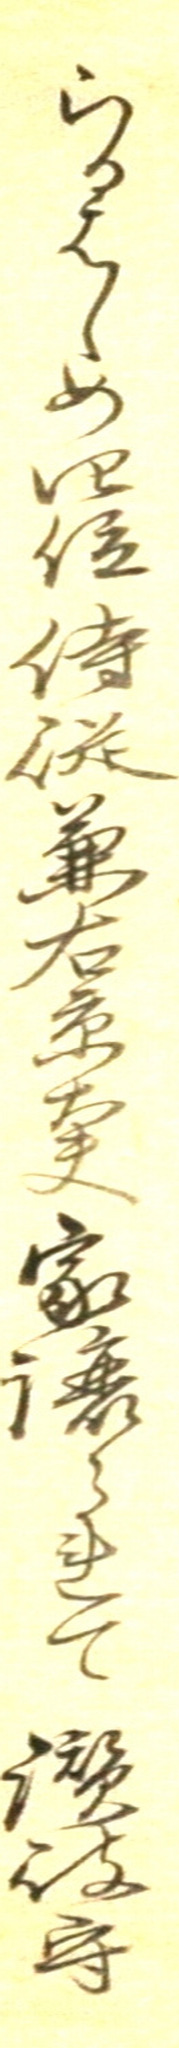らるはしめ四位侍従兼右京大夫家譲られて讃岐守
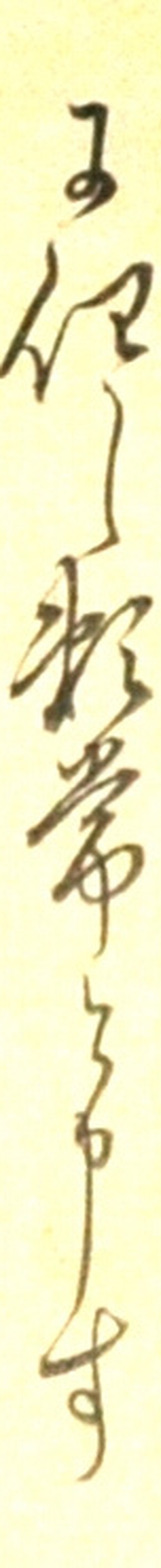に任し頼常と申す
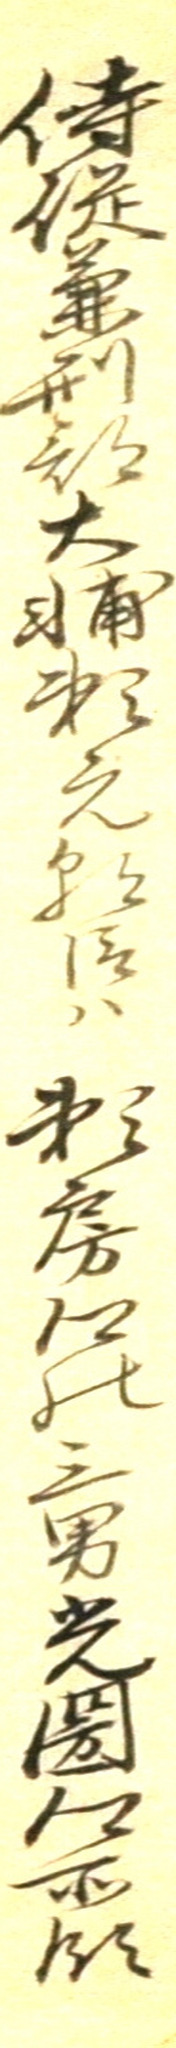侍従兼刑部大輔頼元朝臣は頼房卿の三男光圀卿所領
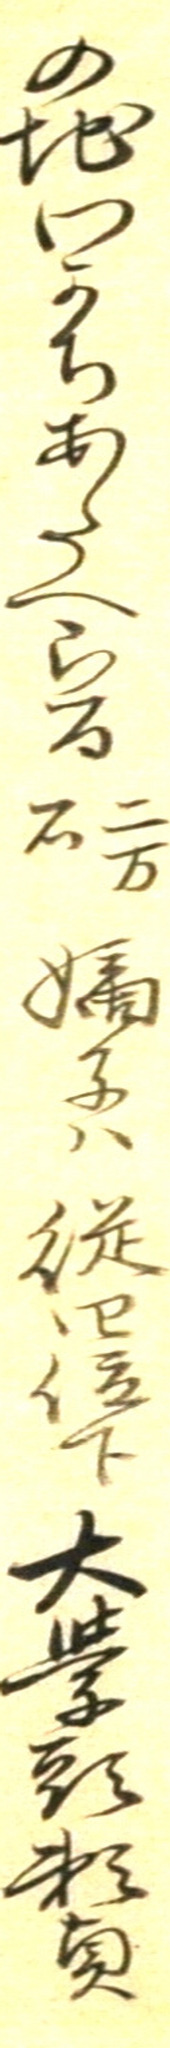の地わかちあたへらる二万石嫡子は従四位下大学頭頼貞
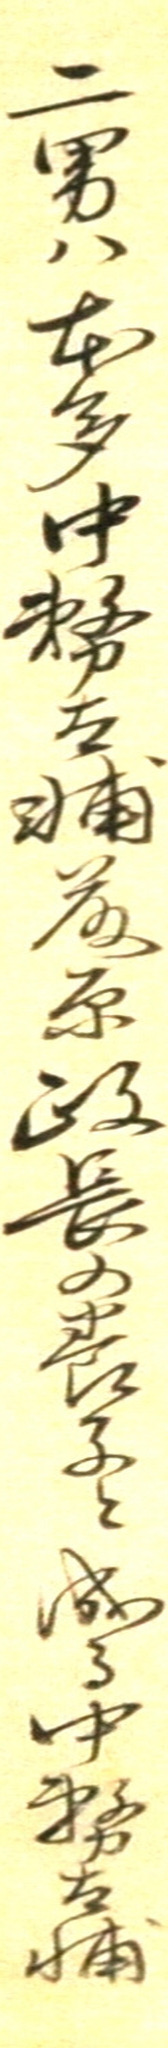二男は本多中務太輔藤原政長の養子と成る中務太輔
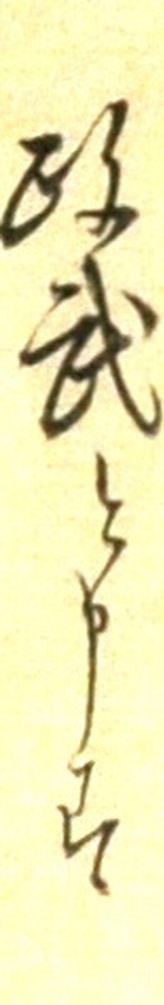政武と申す
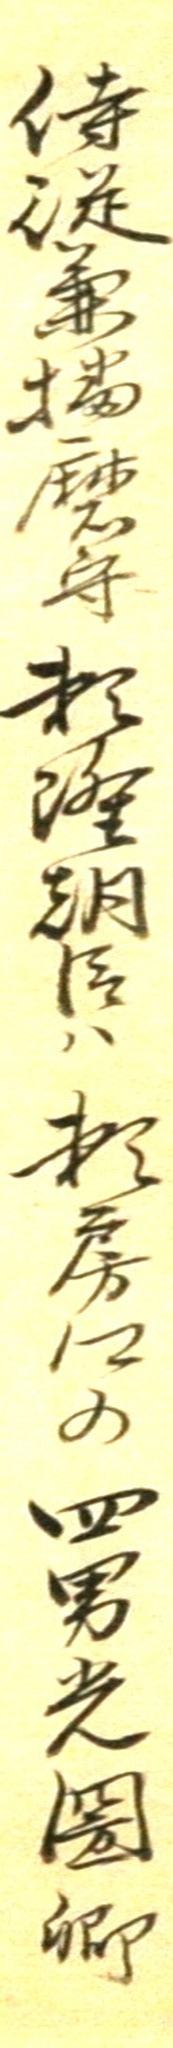侍従兼播磨守頼隆朝臣は頼房卿の四男光圀卿
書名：藩翰譜（一）
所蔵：伊那市立高遠町図書館・合同会社AMANE
